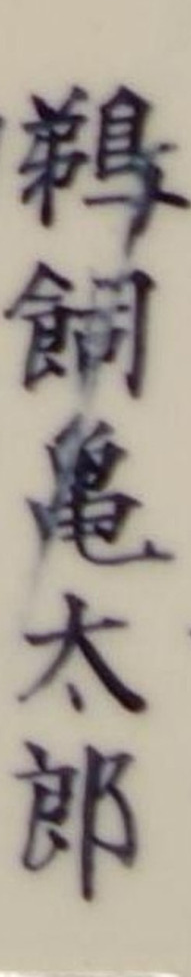鵜飼亀太郎
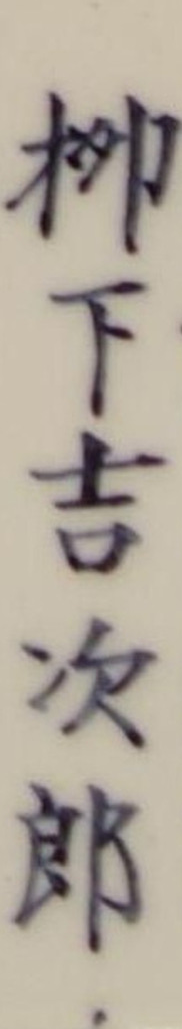柳下吉次郎
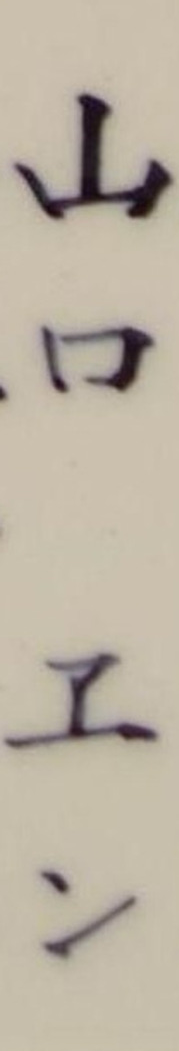山口エン
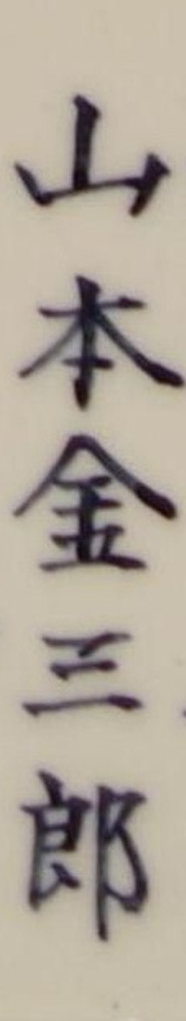山本金三郎
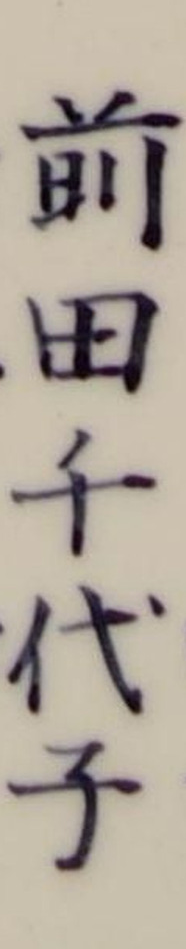前田千代子
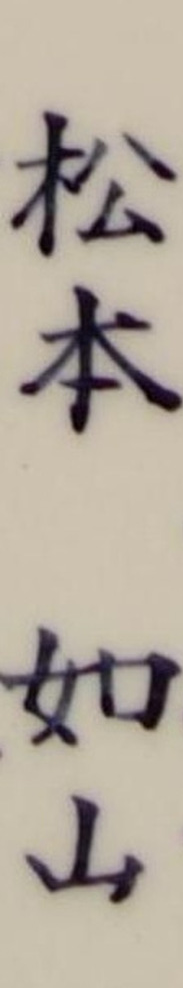松本如山
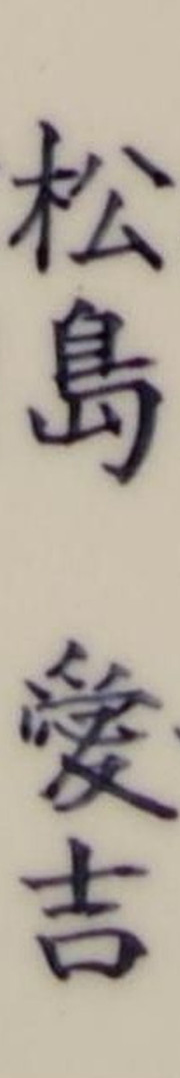松島愛吉
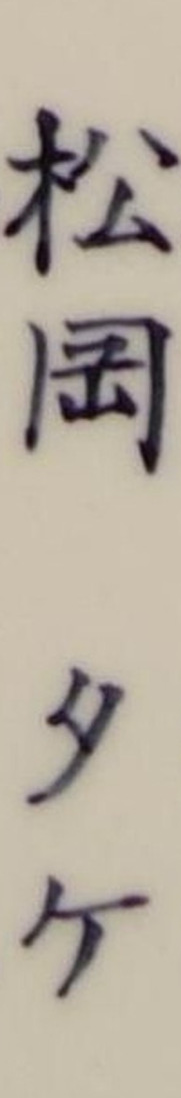松岡タケ
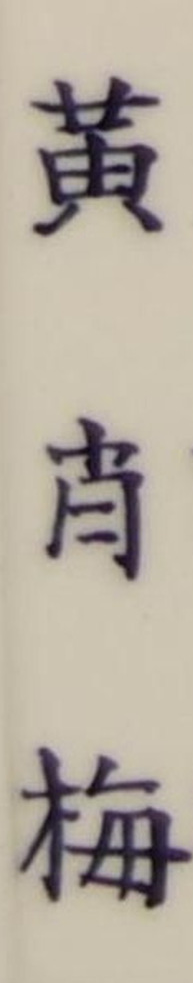黄肖梅

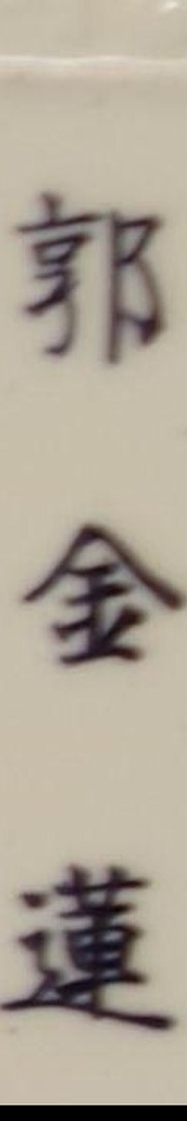郭金蓮
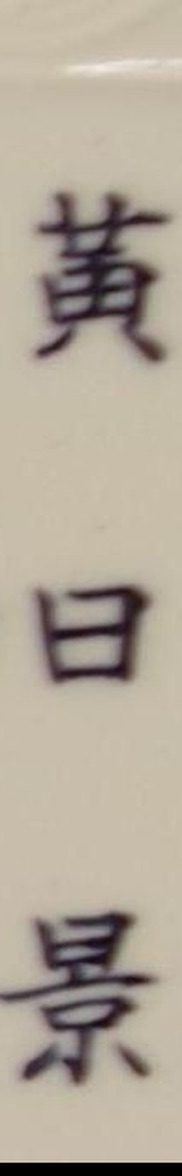黄日景
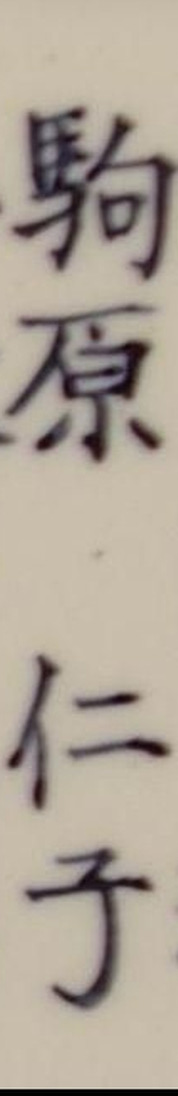駒原仁子
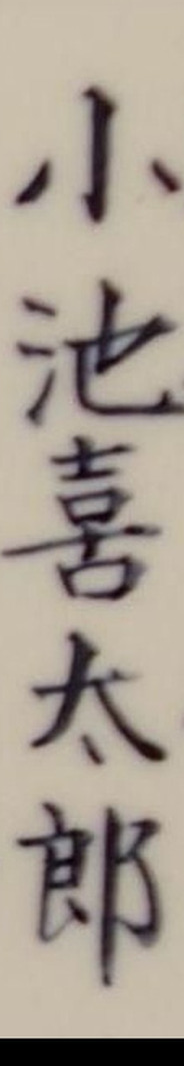小池喜太郎
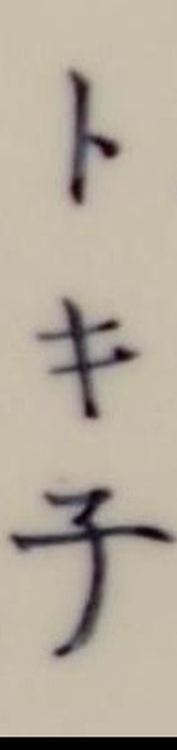トキ子
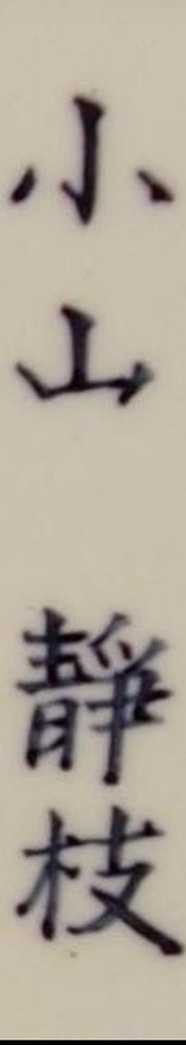小山静枝
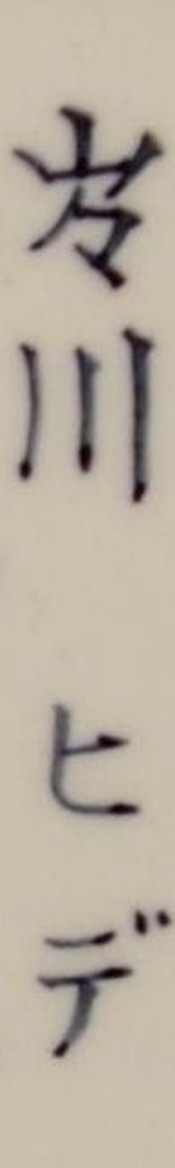出川ヒデ
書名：M~S
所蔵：高野山金剛峯寺
